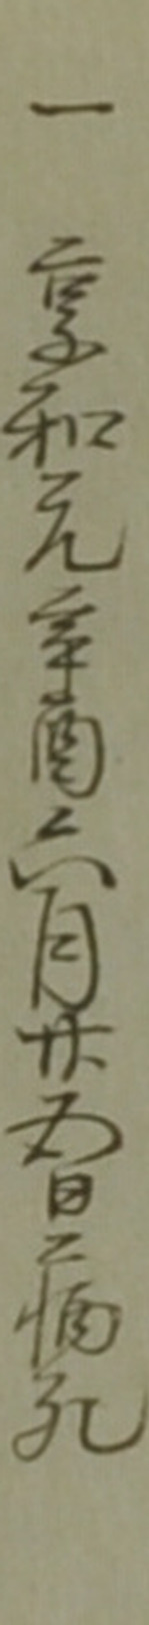一享和元辛酉六月廿五日病死
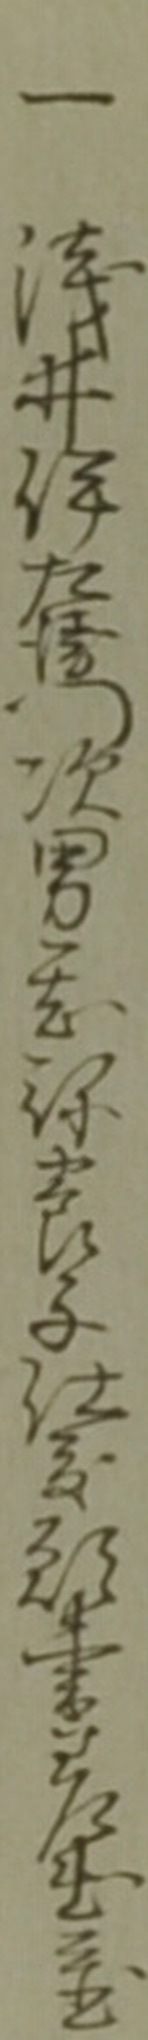一浅井伊左衛門次男甚弥養子仕度願書差出置
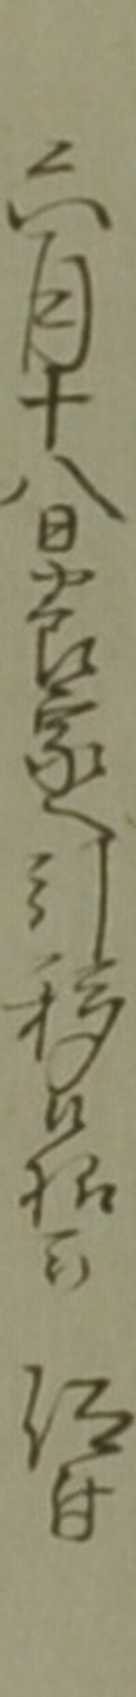六月十八日養家へ引移候様被仰付
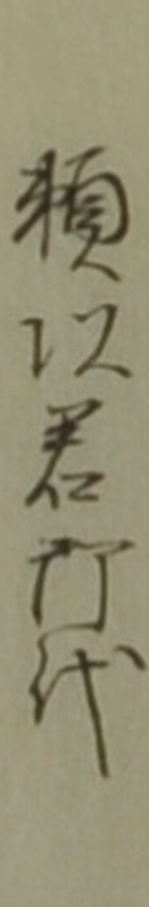頼以君御代
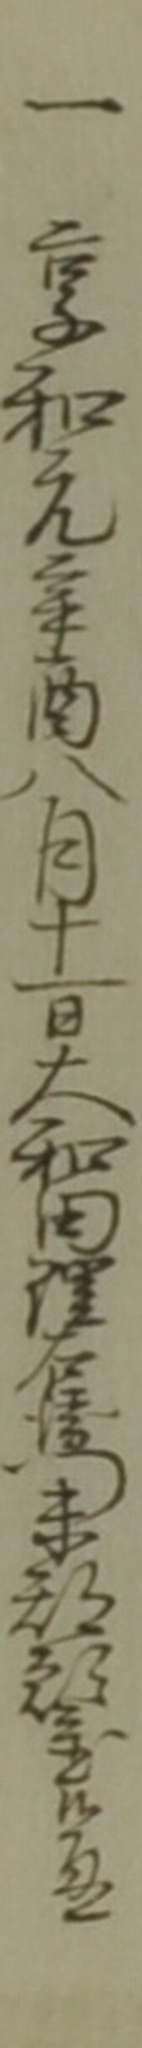一享和元辛酉八月十一日大和田理右衛門末期願置候通
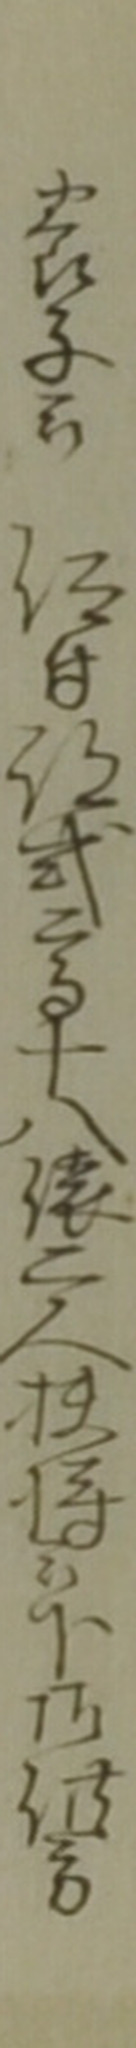養子被仰付跡式高十八俵二人扶持被下御供方
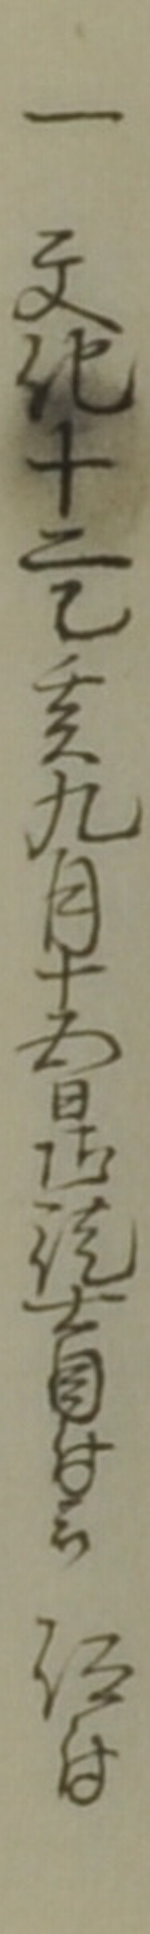一文化十二乙亥九月十五日御徒士目付被仰付
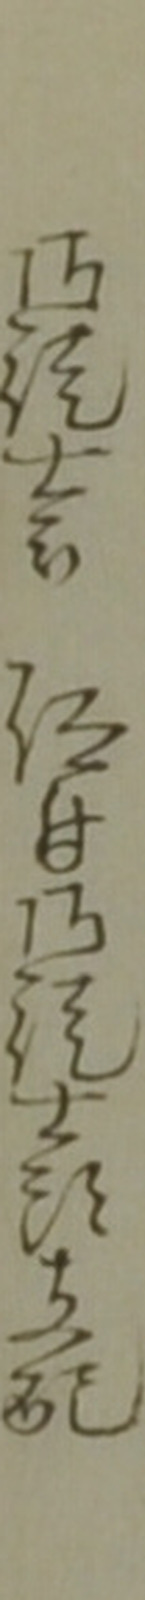御徒士被仰付御徒士頭支配
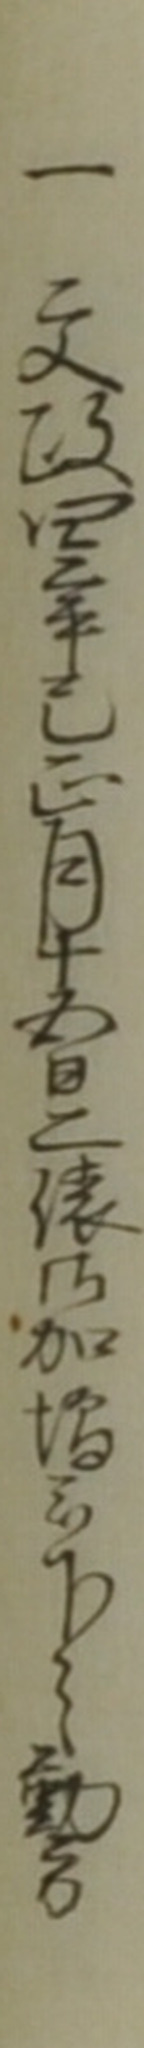一文政四辛巳正月十五日二俵御加増被下之勤方
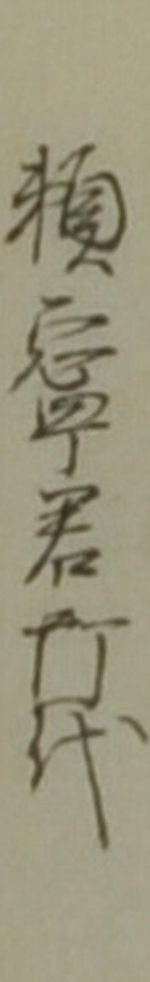頼寧君御代
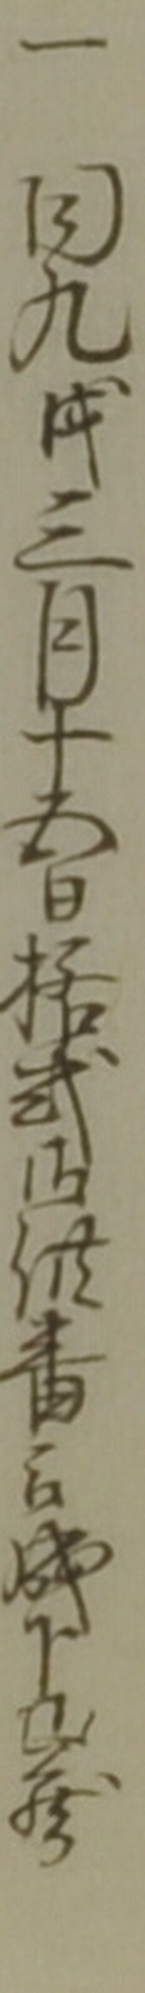一同九戌三月十五日格式御供番被成下御蔵
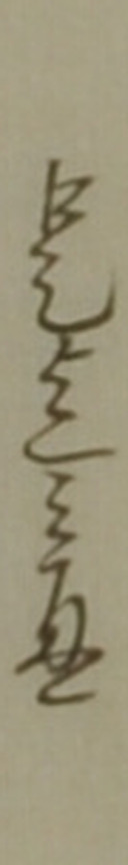是迄之通
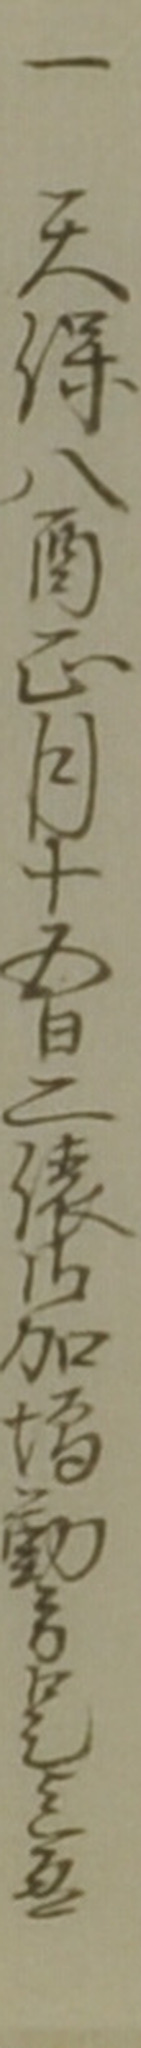一天保八酉正月十五日二俵御加増勤方是迄通
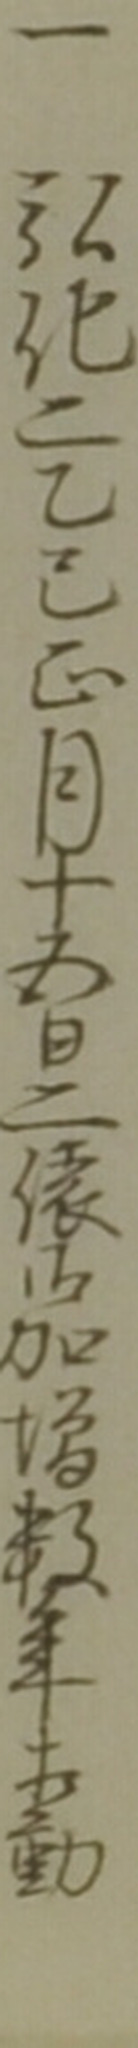一弘化二乙巳正月十五日二俵御加増数年相勤
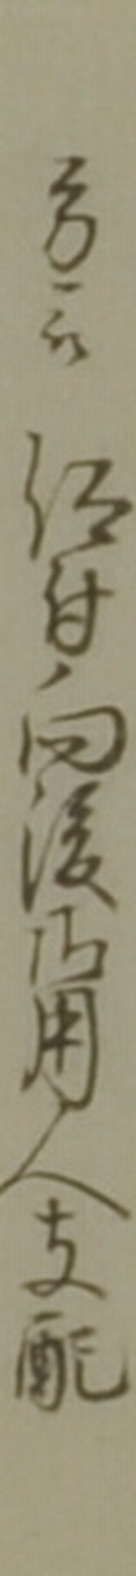方被仰付向後御用人支配
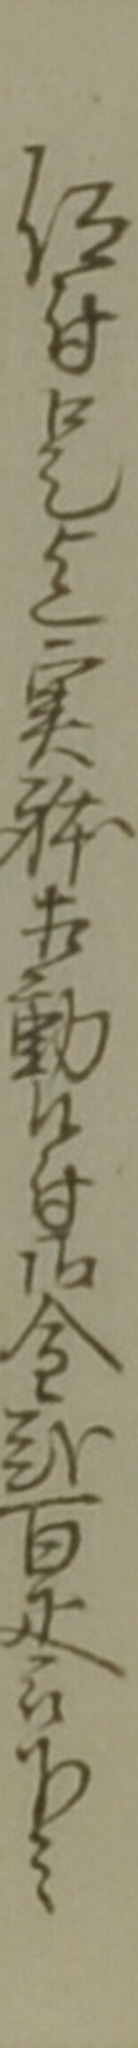仰付是迄実体相勤候付御金弐百疋被下之
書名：無足諸士勤仕録（三）
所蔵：伊那市立高遠町図書館・合同会社AMANE
